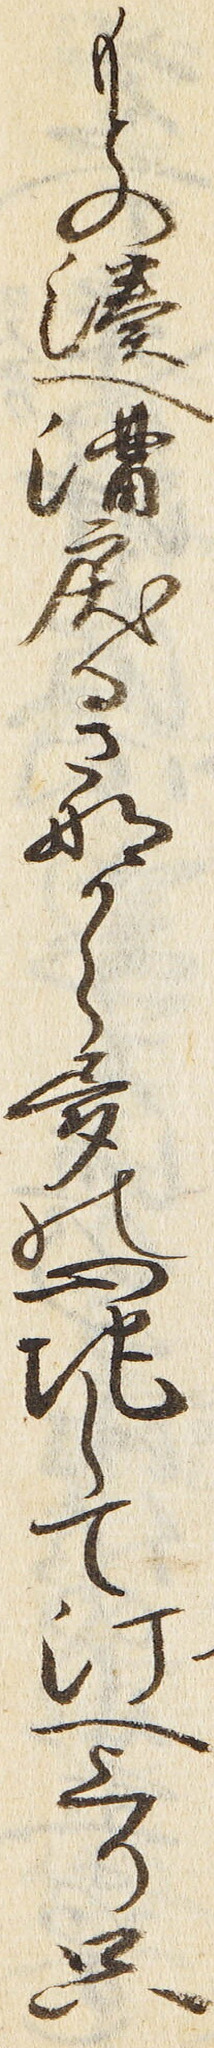もとの湊へ漕戻るさなから夢の心地して汀へ上り只
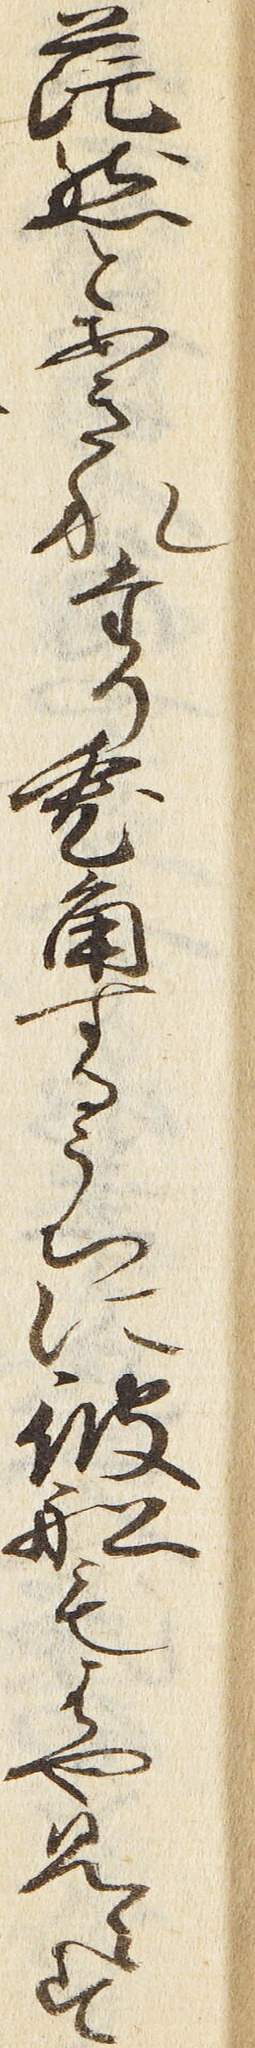茫然とあきれたり兎角するうちに彼船もはや見えす
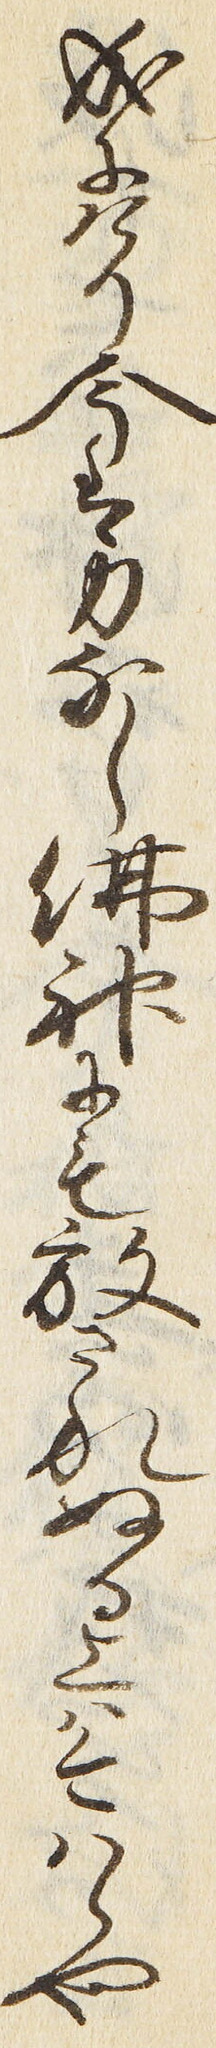成にけり今は力なし仏神にも放されぬる上は今はゝや
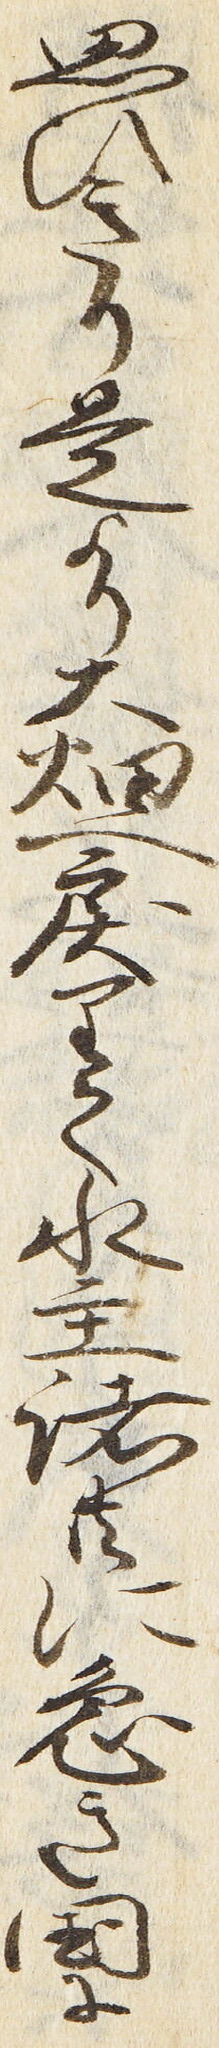思ひきり是より大畑へ戻りて水主諸共に急き国に
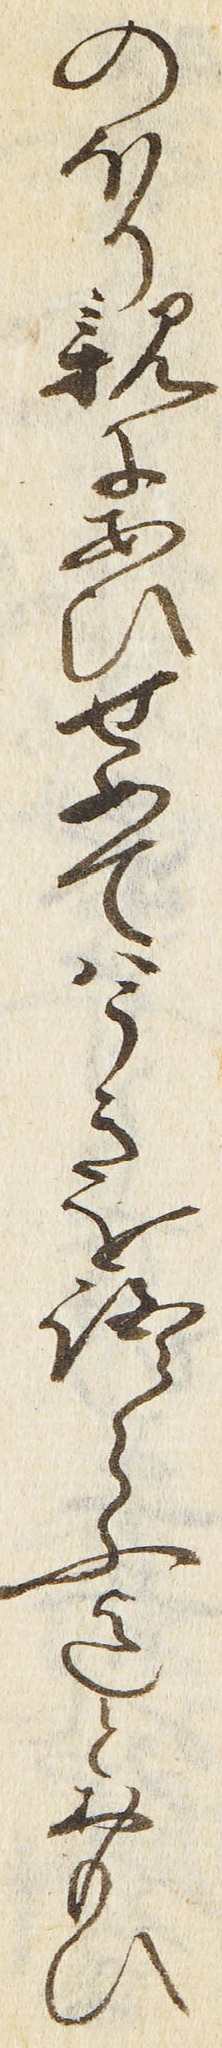のほり親子あひせめてハうきを語らふ迄とおもひ
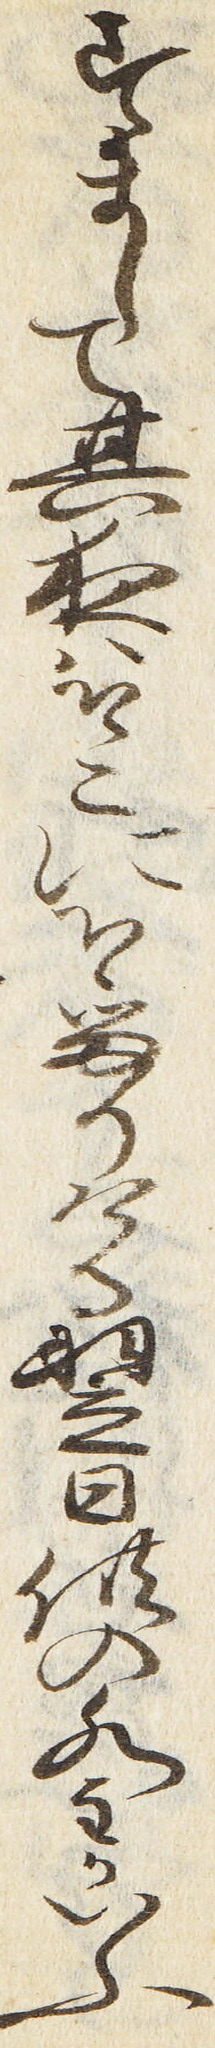すまして其夜はそこにそ留りける翌日供の水主かいふ
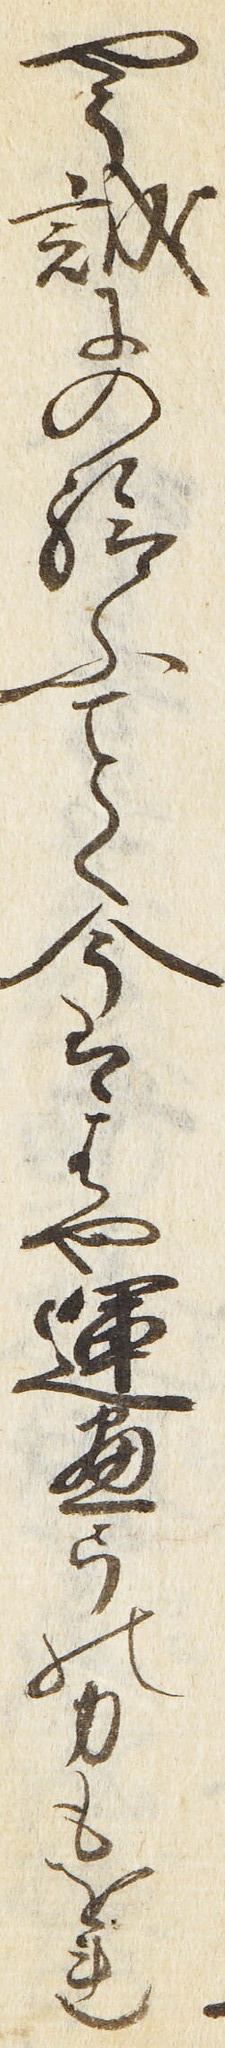やう誠にの給ふことく今ははや運尽弓の力もをれ
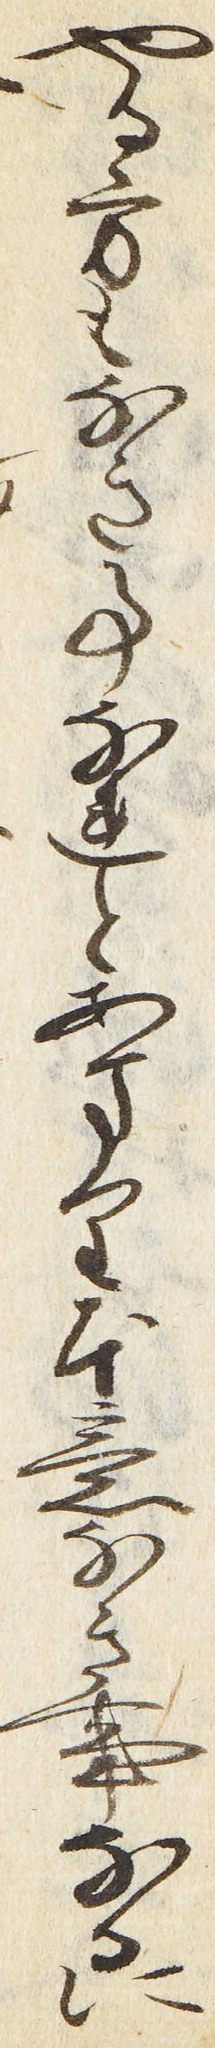やる方もなき事なれとあまり本意なき事なるに
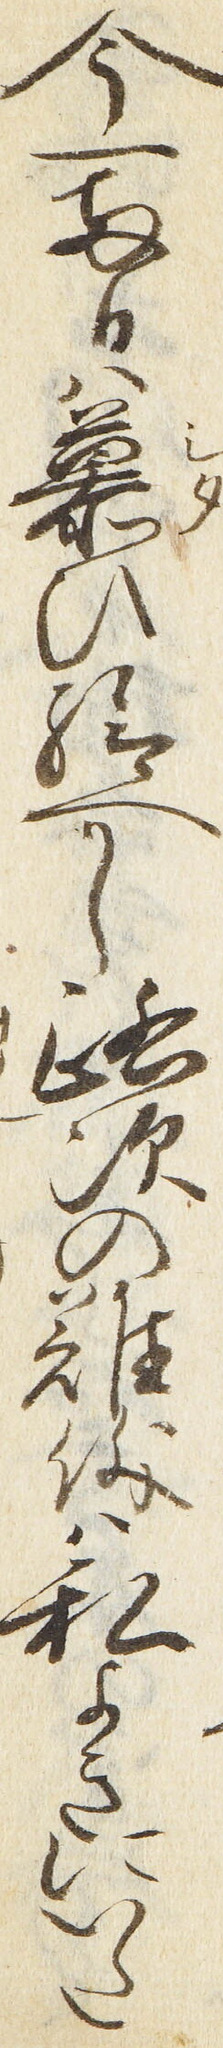今一両日は慕ひ給へかし路次の難儀は私よきにいた
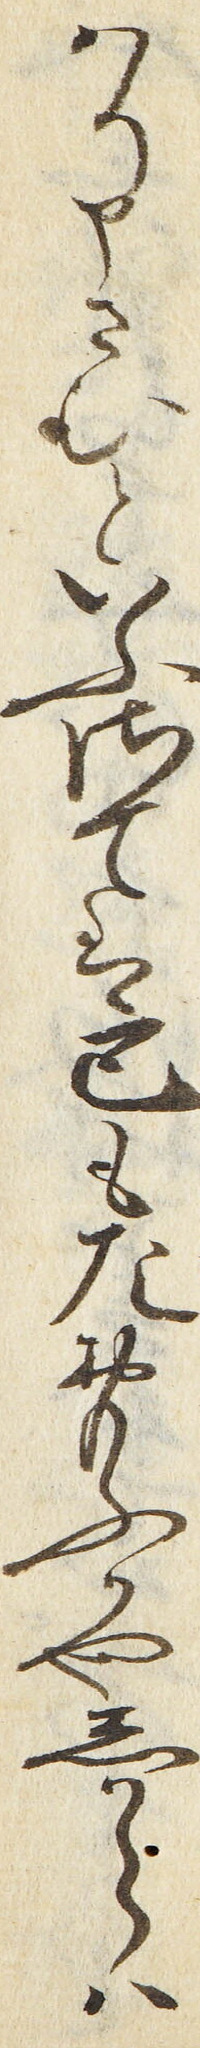はり申さむといふさては己も左おもふかやしからは

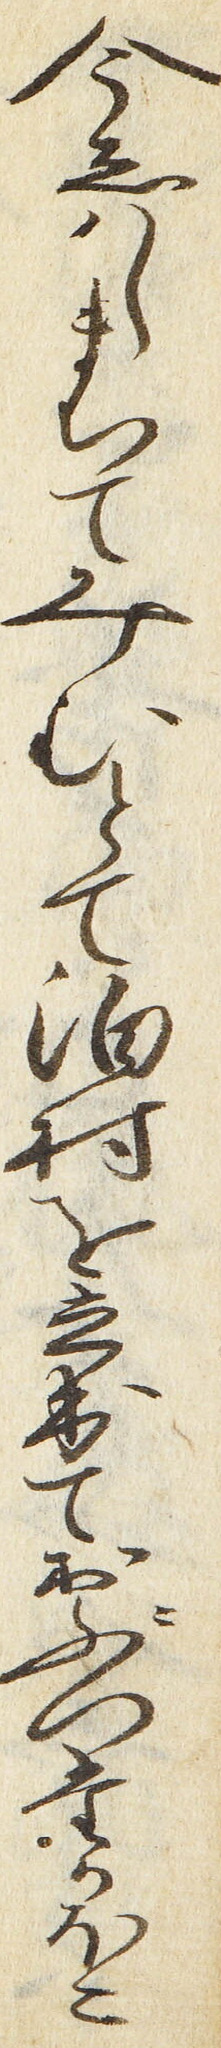今しはしまちてみむとて泊村を立出ておぶつたかほこ
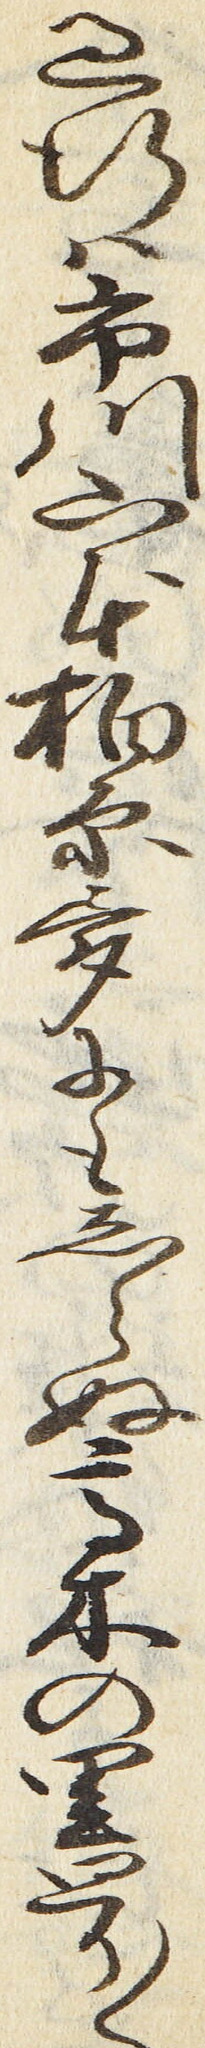過行は市川山本柏原夢にもしらぬ高木の里廻り〳〵
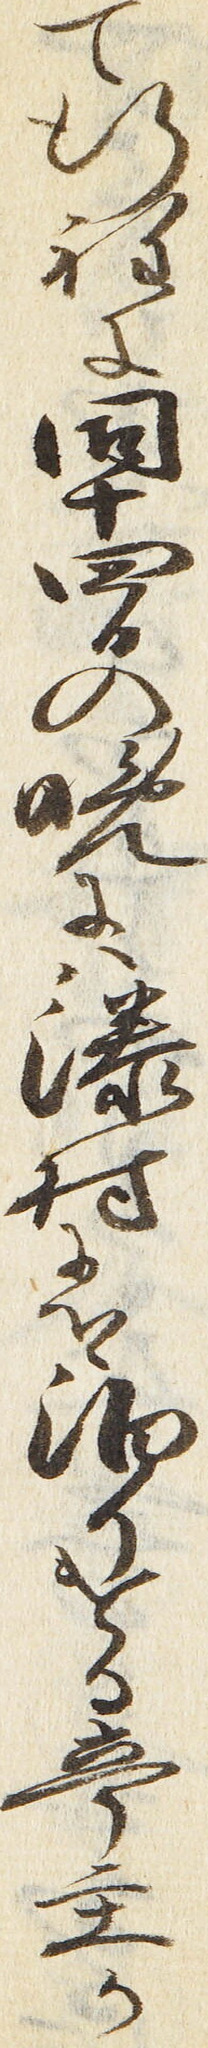て行程に同十四日の晩には湊村にそ泊りける亭主か
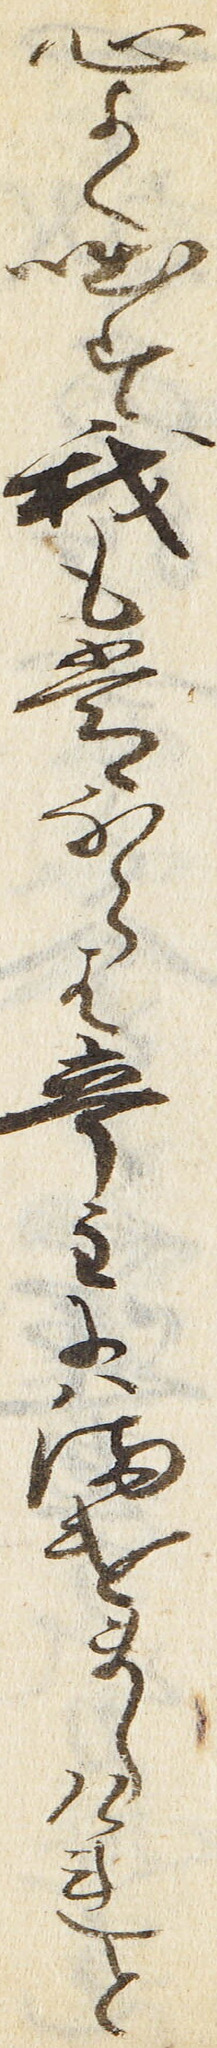心よく咄す我も常ならは亭主にはまけましけれと
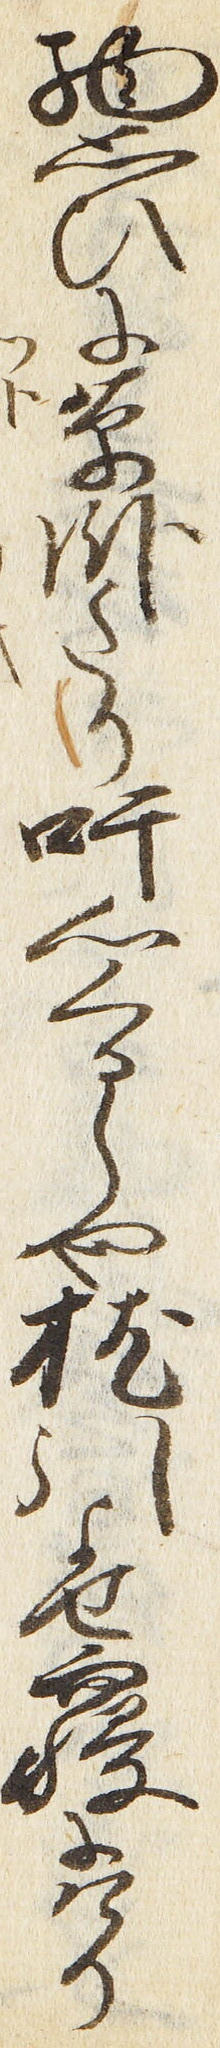物思ひに草臥たり吁心くるしや枕引よせ寝にけり
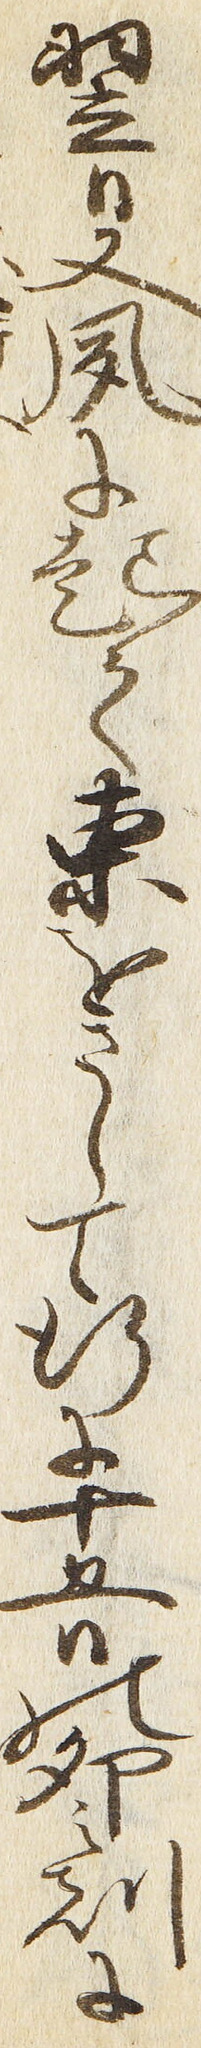翌日又夙に起て東をさして行に十五日の卯之刻に
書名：海陸世話日記
